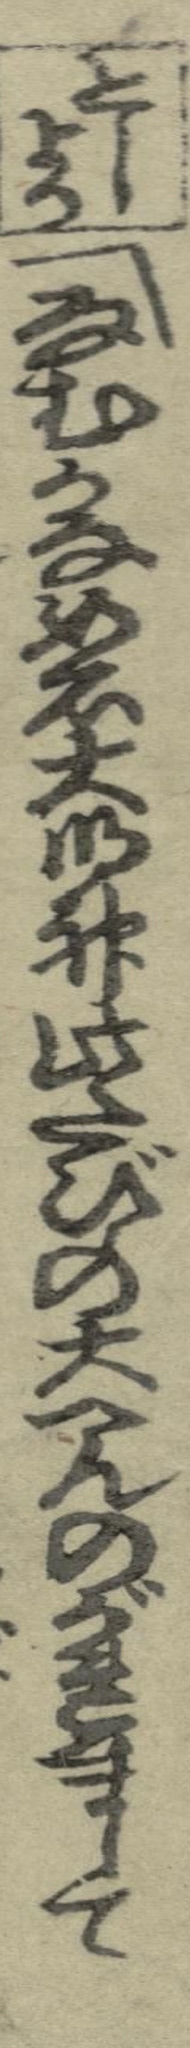としよりなむかなめ石大明神此たびの大へんのがれまして
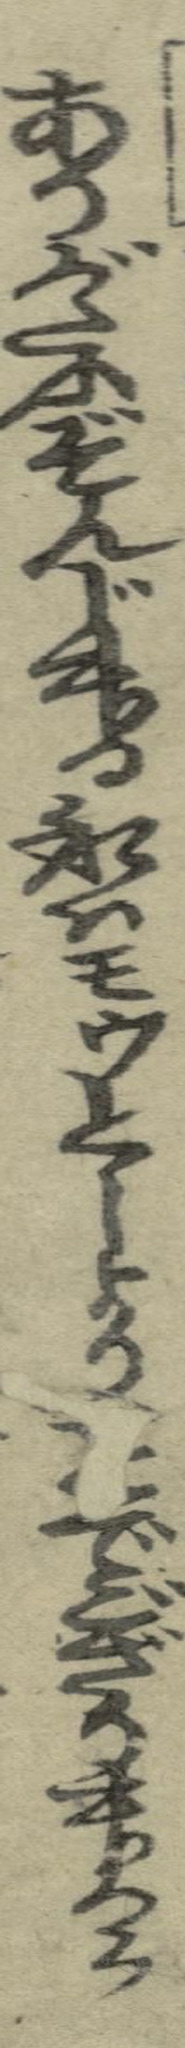ありがたふぞんじ升る私はモウとしよりことでござり升から
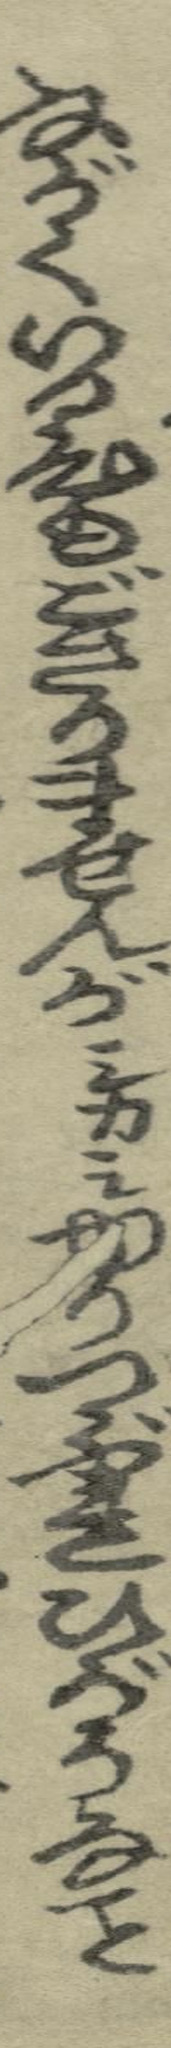ながくいる心もござりませんがシカシゆりつぶれひがうなこと
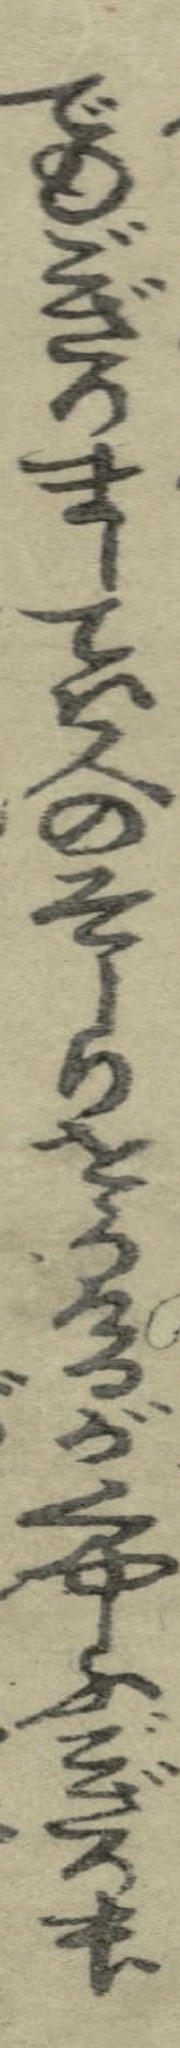でもござりましては人のそしりをうけるがくやしふござり升
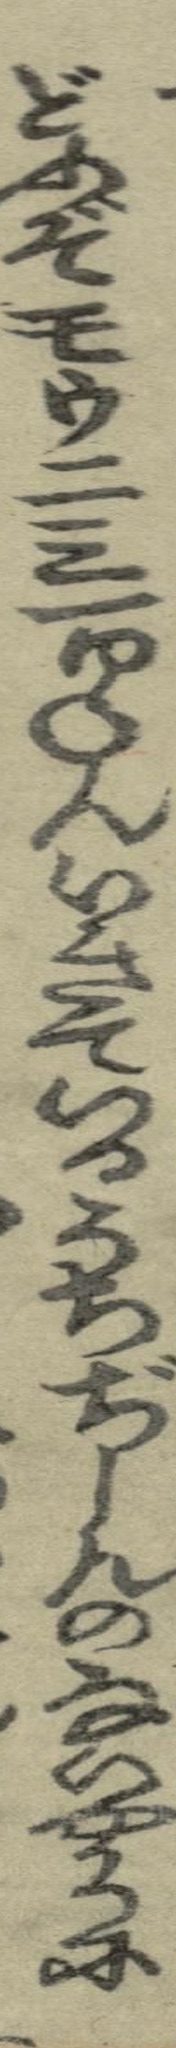どふぞもう二三百ねんいきているうちぢしんのないやうに
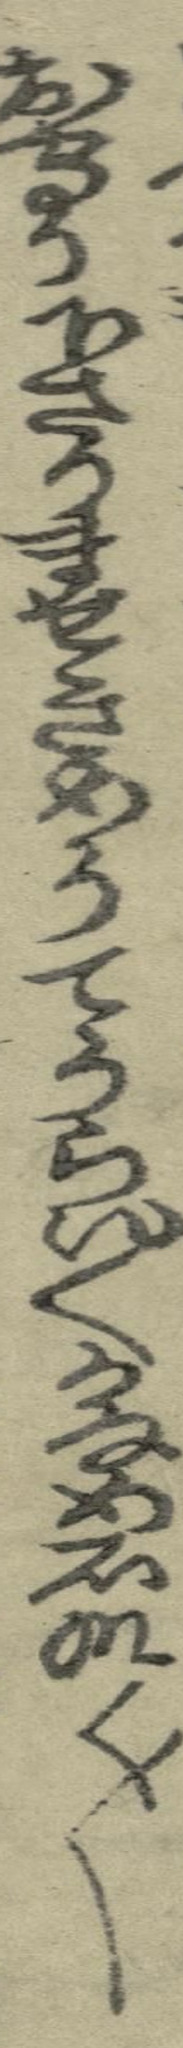お守り下さりませきめうてうらい〳〵かなめ石様〳〵〳〵
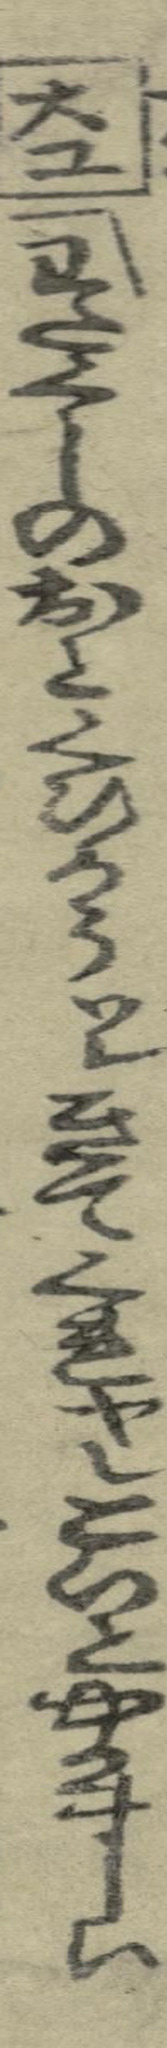大工〽わたくしのおとくいからソレきてくれヤレこいとやかましひ
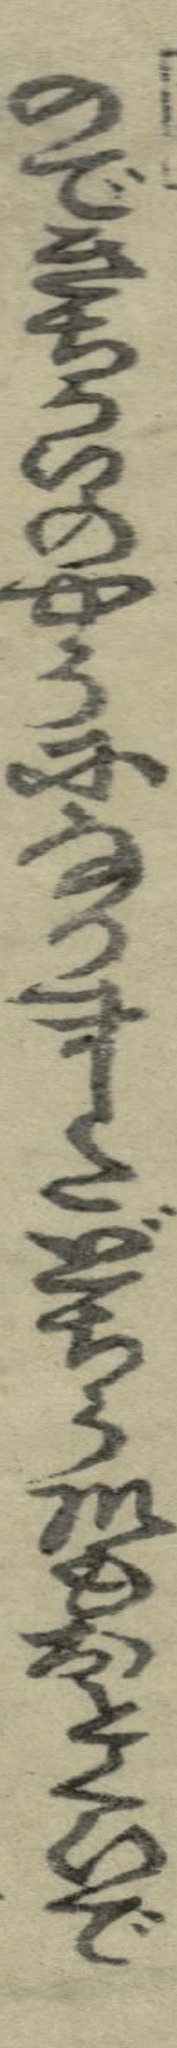のできちかいのやうになりましたどちら様もおとくいで
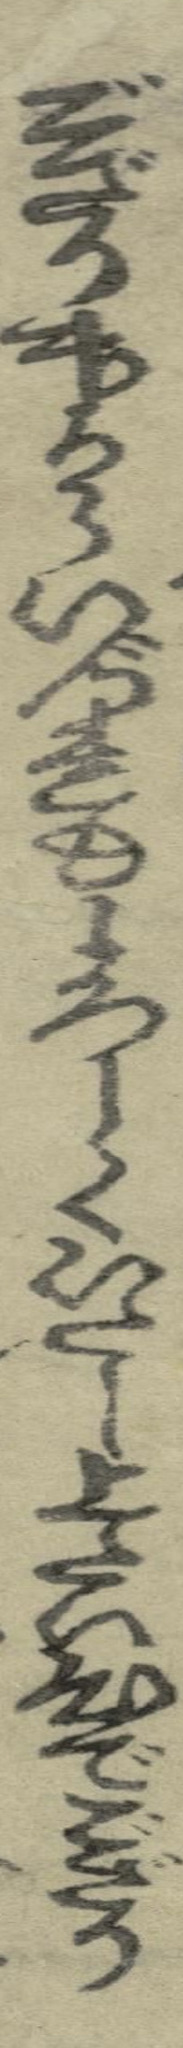ござり升からいづれもよろしくいたし上たい心でござり
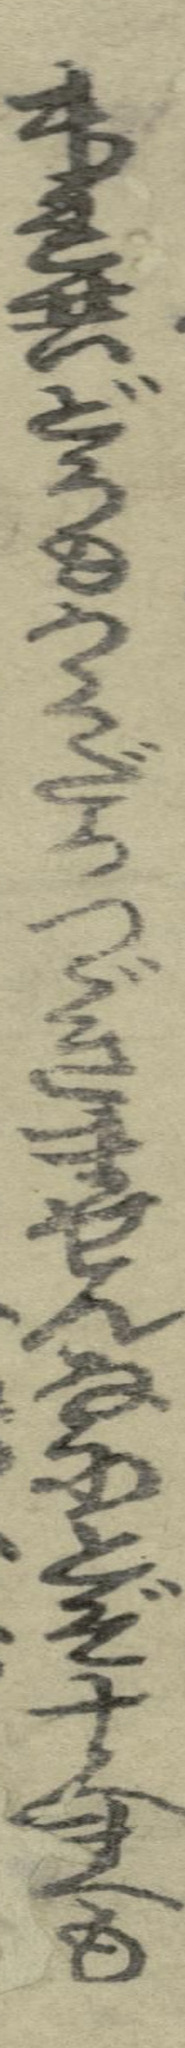升れ共どうもからだかつゞきませんなにとぞ十人まへも
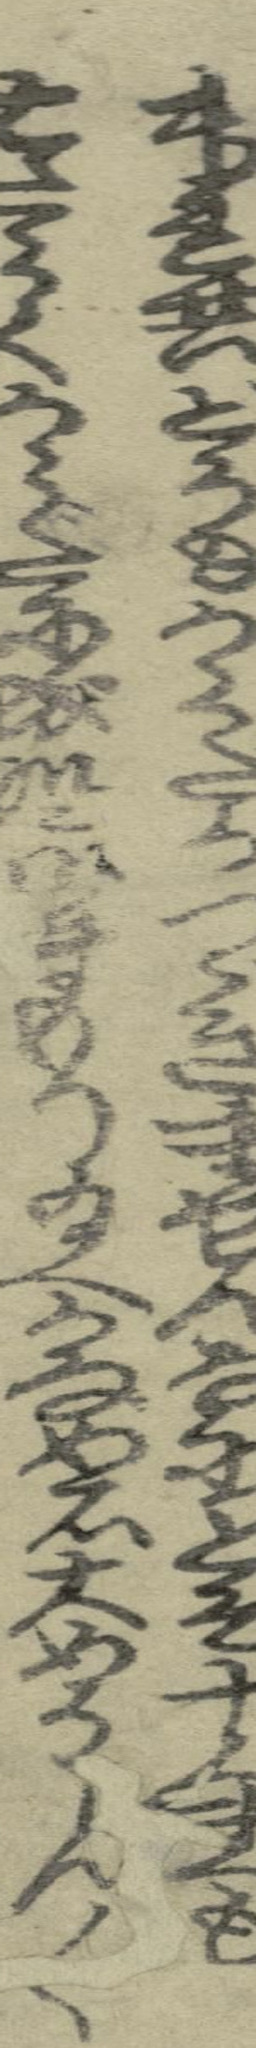はたらくからだに成様ニ御まもり給へかなめ石大めうしん〳〵
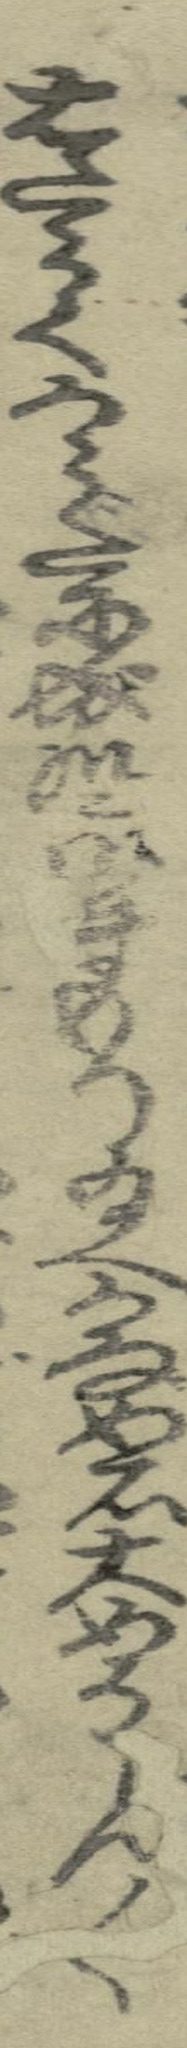はたらくからだに成様ニ御まもり給へかなめ石大めうしん〳〵
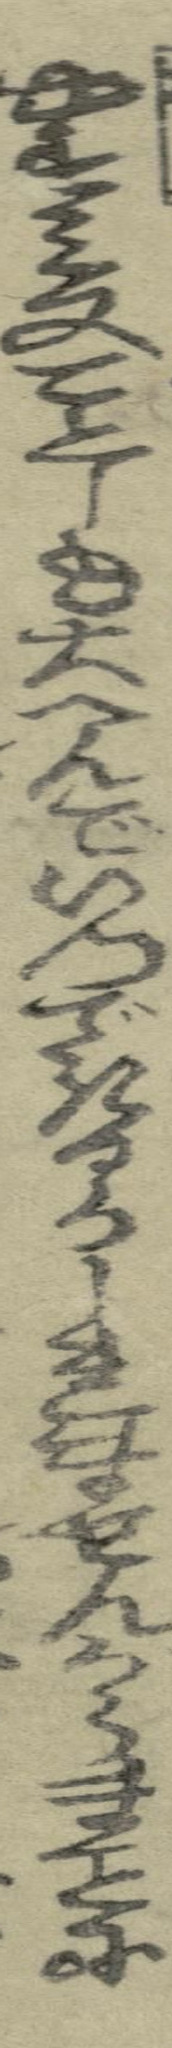やすみ又今年も大へんでいつできるかしれませんからまことに
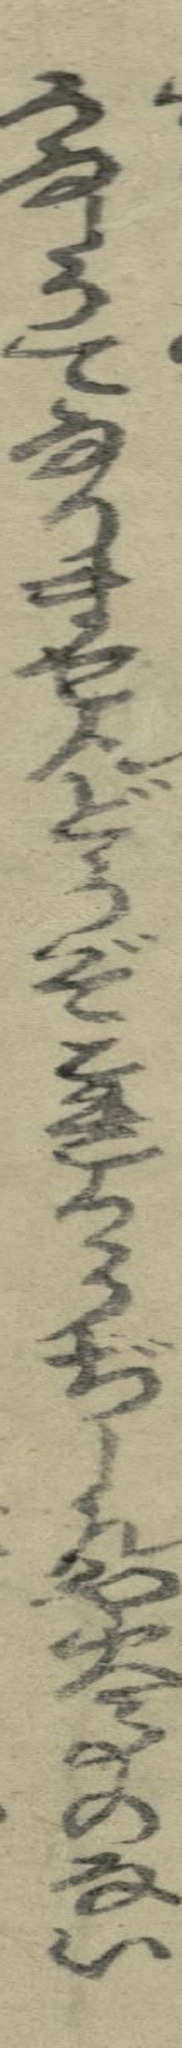かなしうてなりませんどうぞこれからぢしんや火事のない
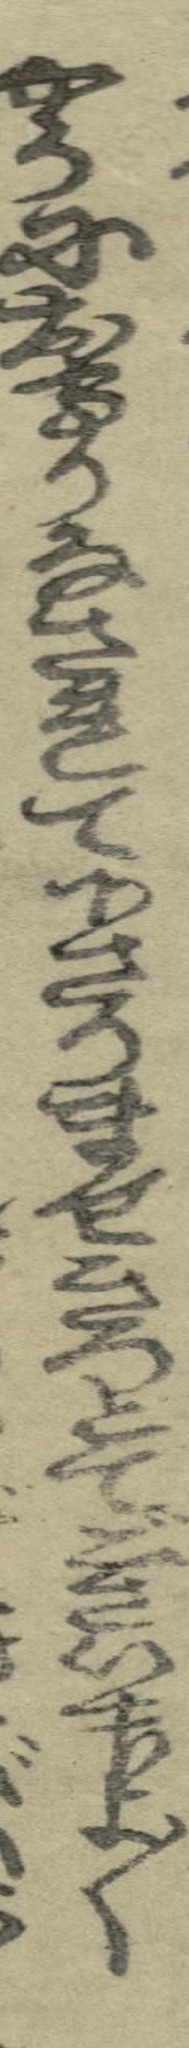やうにお守りなされて下さりませきつとてごさい升よ〳〵
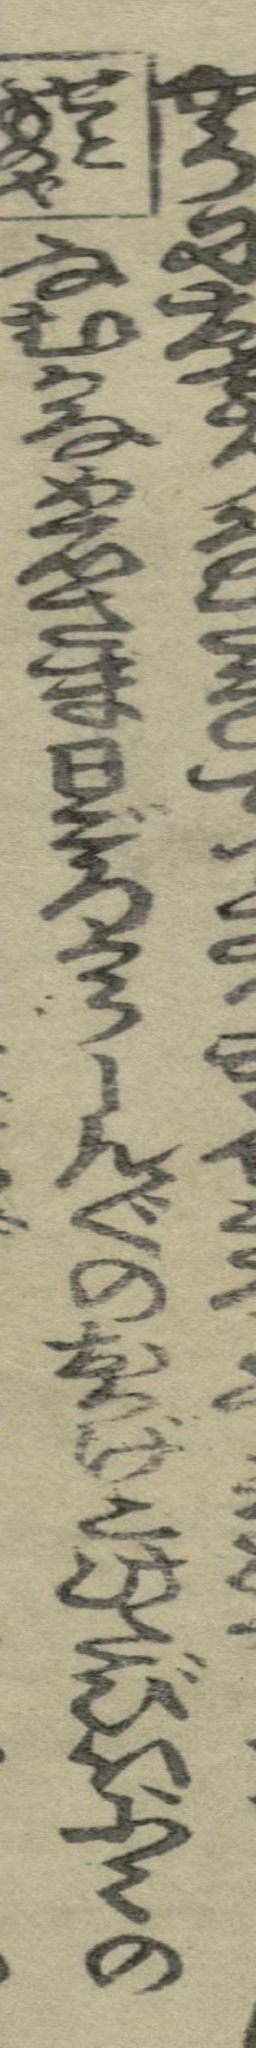せとものやなむかなめ石さま日ごろからしん〴〵のおかげと？此たびは少〻の
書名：あんしん要石
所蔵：東京大学地震研究所図書室 Earthquake Research Institute Library, The University of Tokyo, JAPAN
